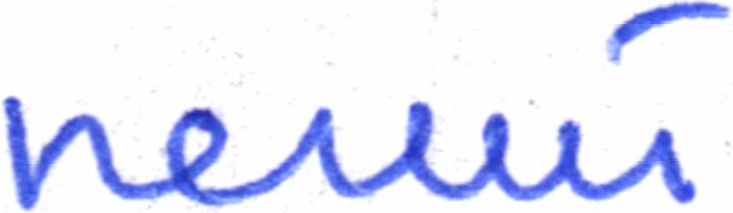пегий
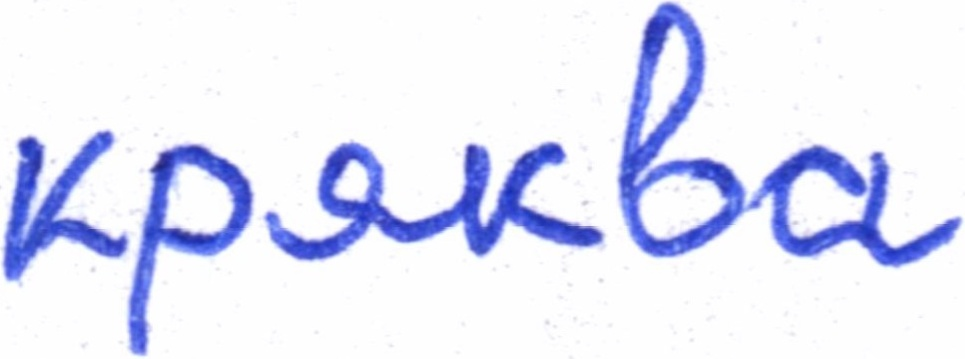кряква
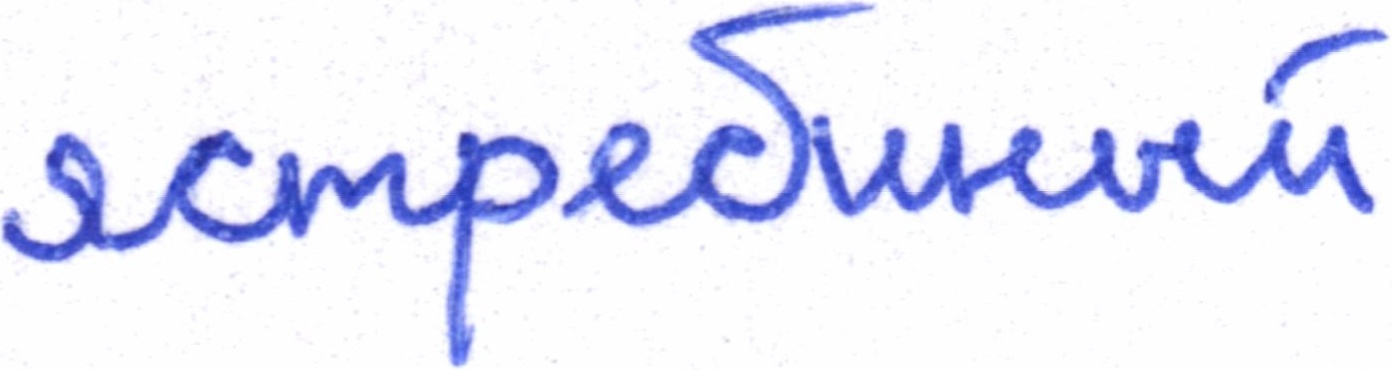ястребиный
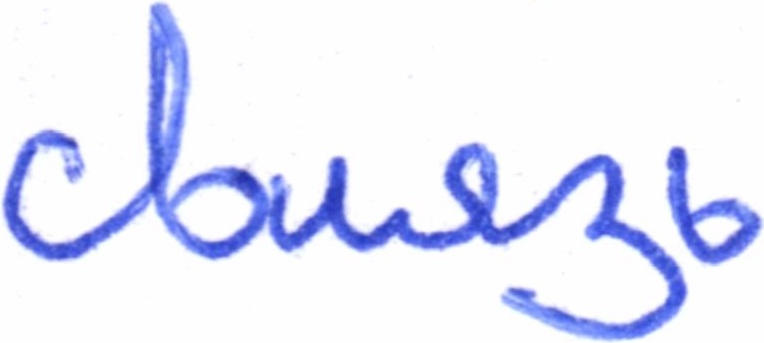свиязь
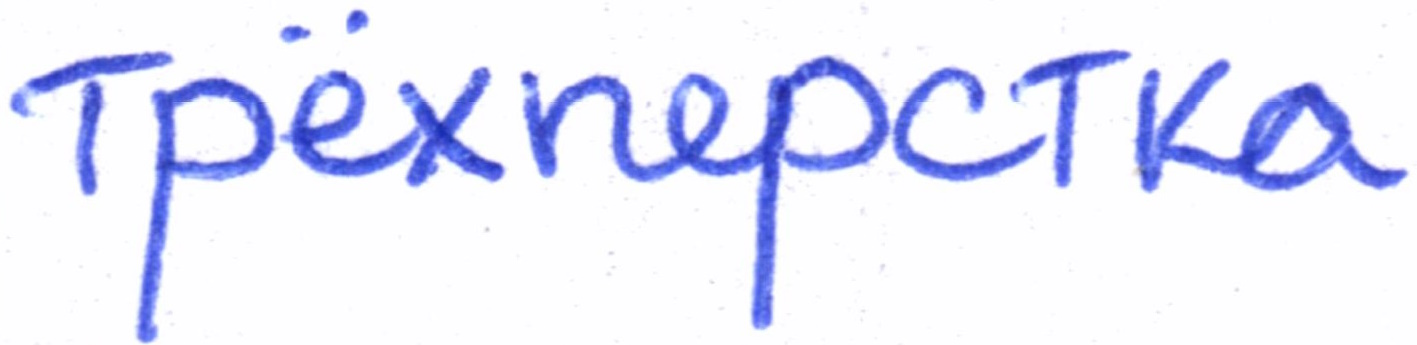трёхперстка
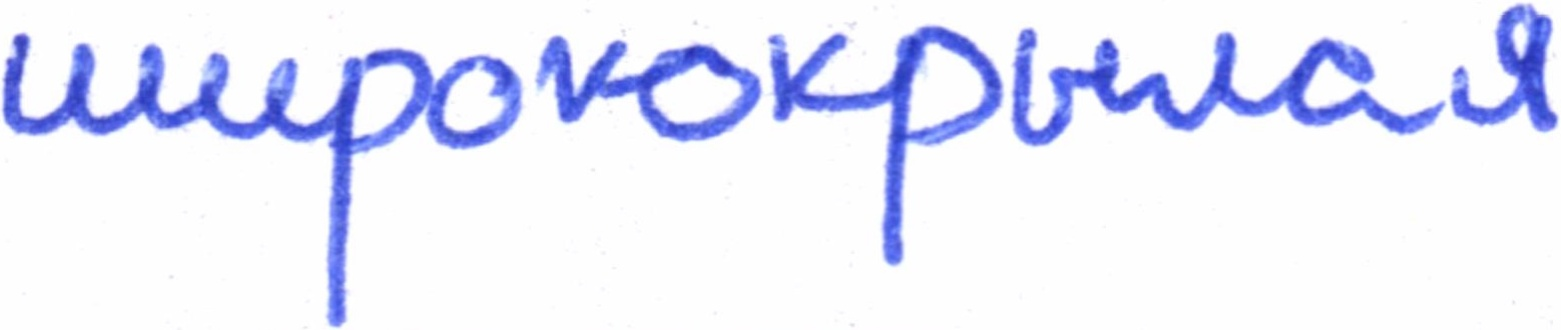ширококрылая
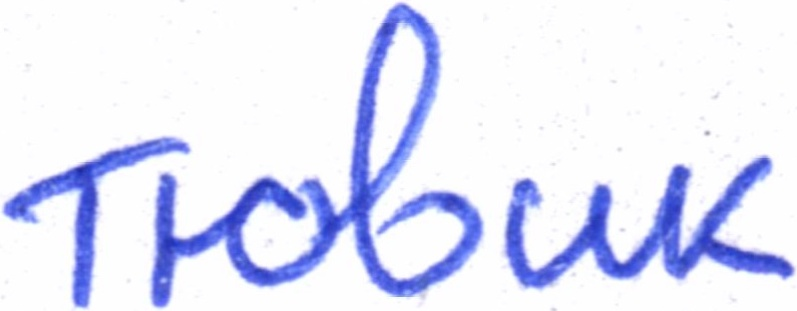тювик
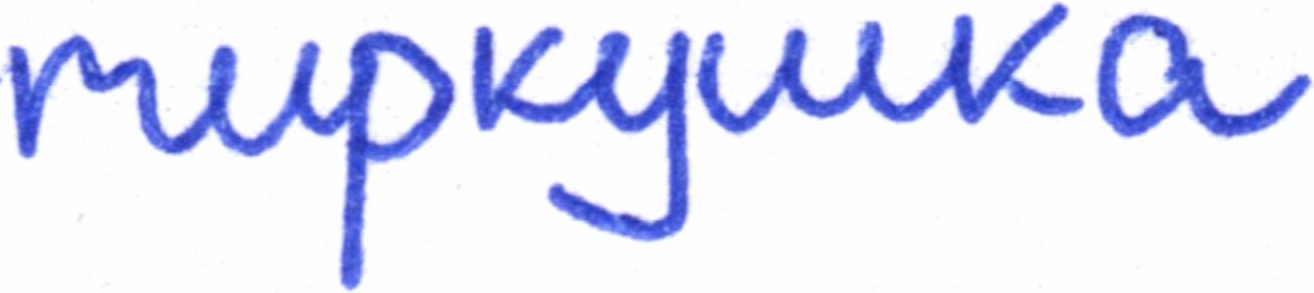тиркушка
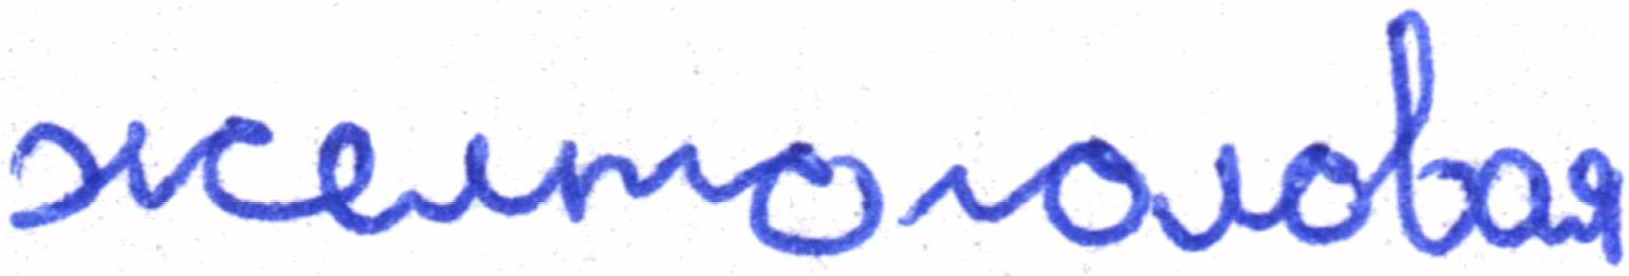желтоголовая
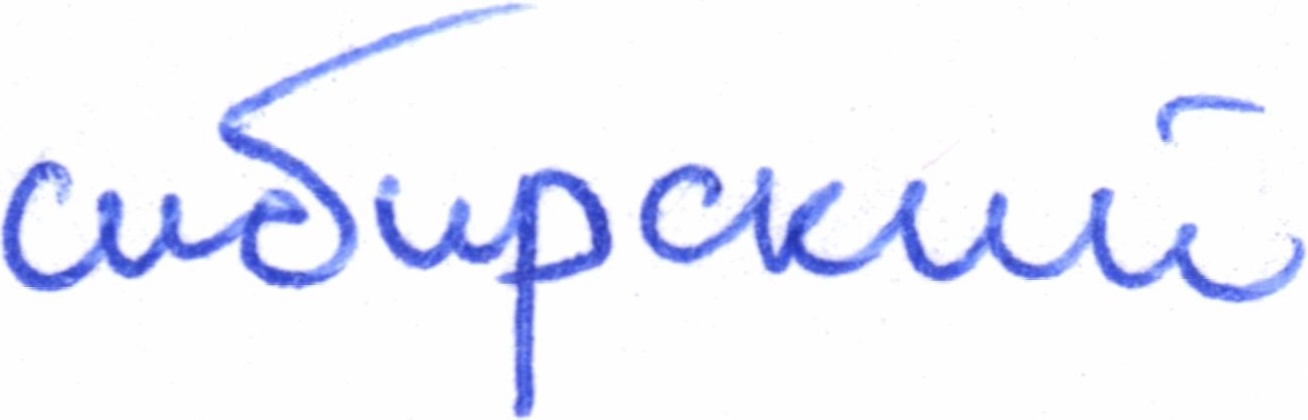сибирский
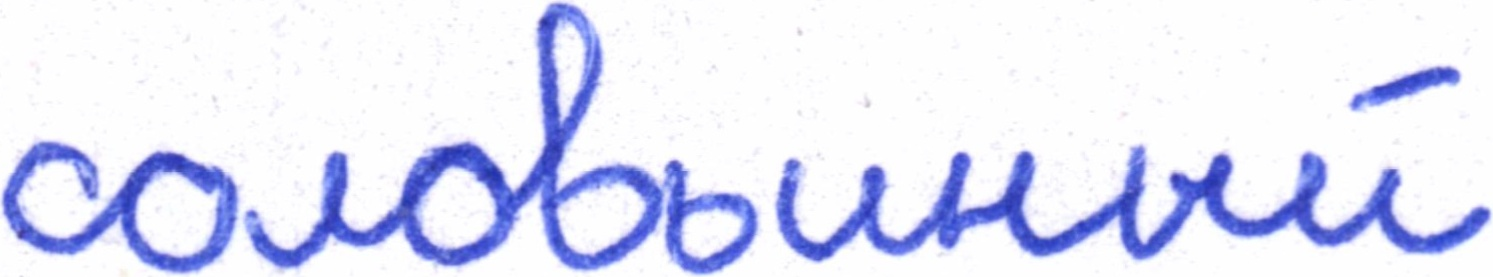соловьиный
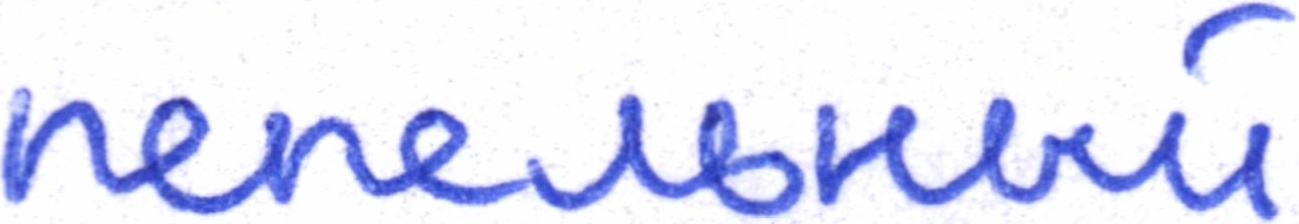пепельный
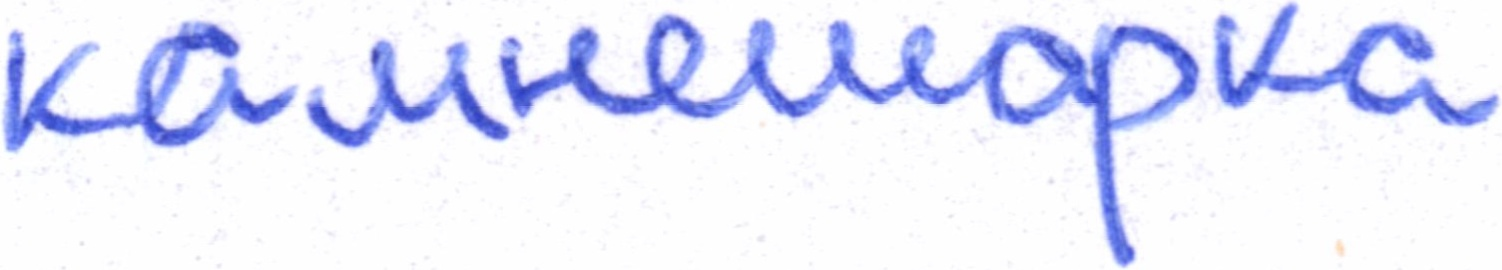камнешарка
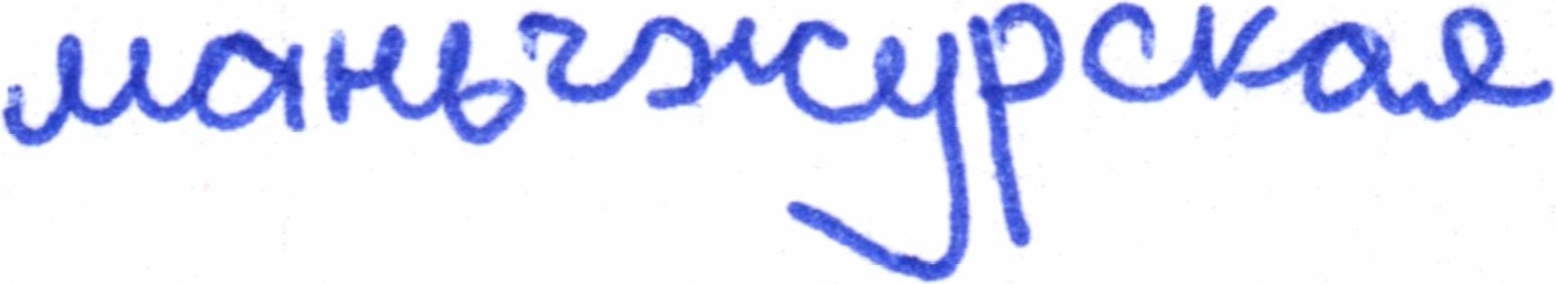маньчжурская
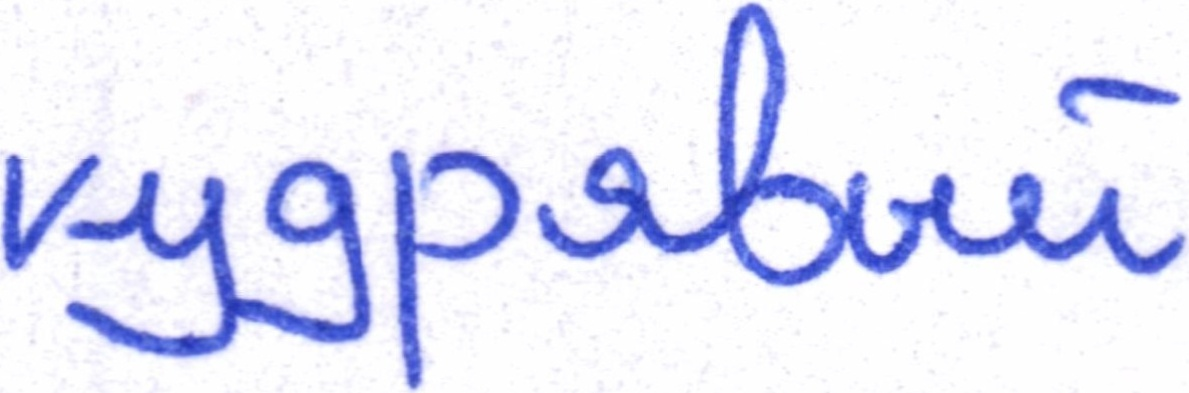кудрявый
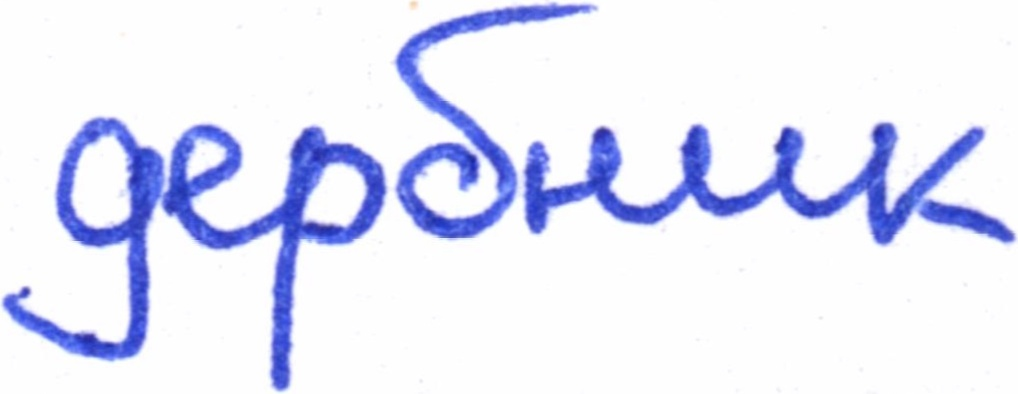дербник
